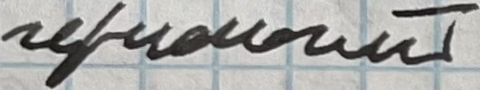черноногий
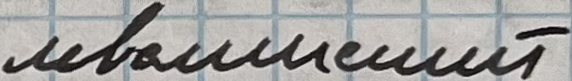левантский
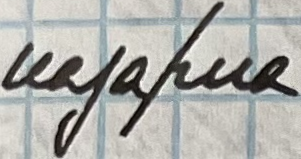казарка
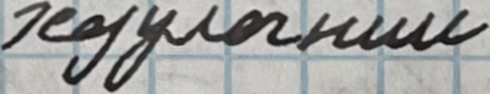ходулочник
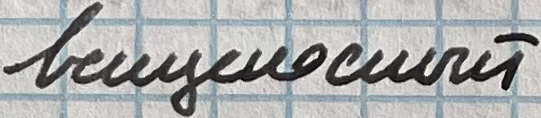венценосный
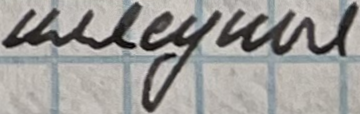плясунья
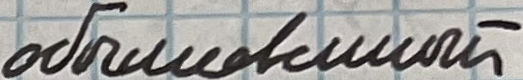обыкновенный
